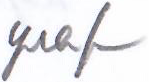улар
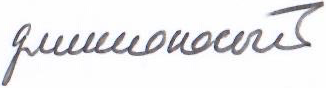длинноносый
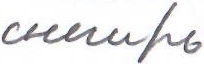снегирь
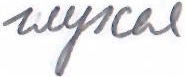глухая
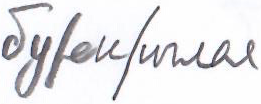бурокрылая
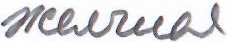желчная
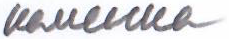каменка
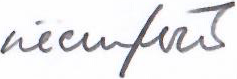пёстрый
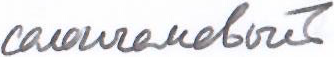солончаковый
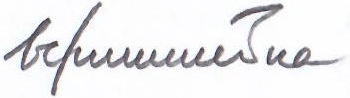вертишейка
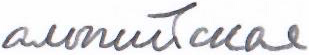альпийская
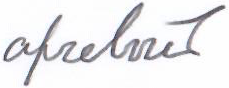арчевый
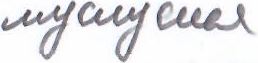мускусная
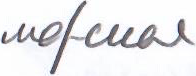морская
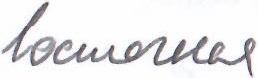восточная
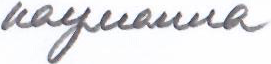науманна
